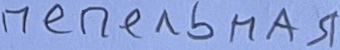пепельная
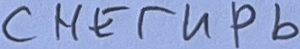снегирь
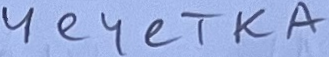чечетка
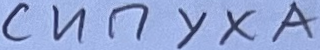сипуха
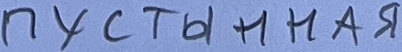пустынная
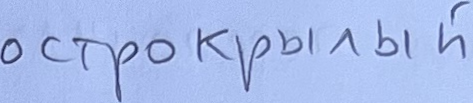острокрылый
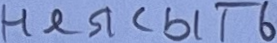неясыть
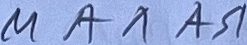малая
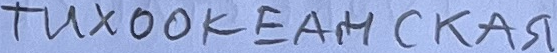тихоокеанская
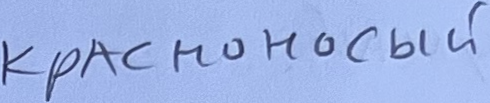красноносый
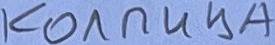колпица
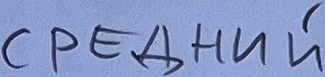средний
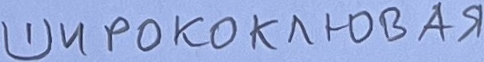ширококлювая
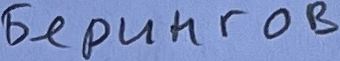берингов
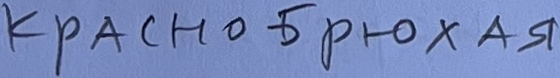краснобрюхая
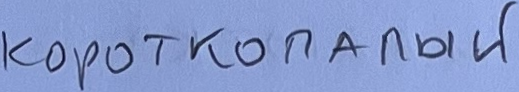короткопалый
